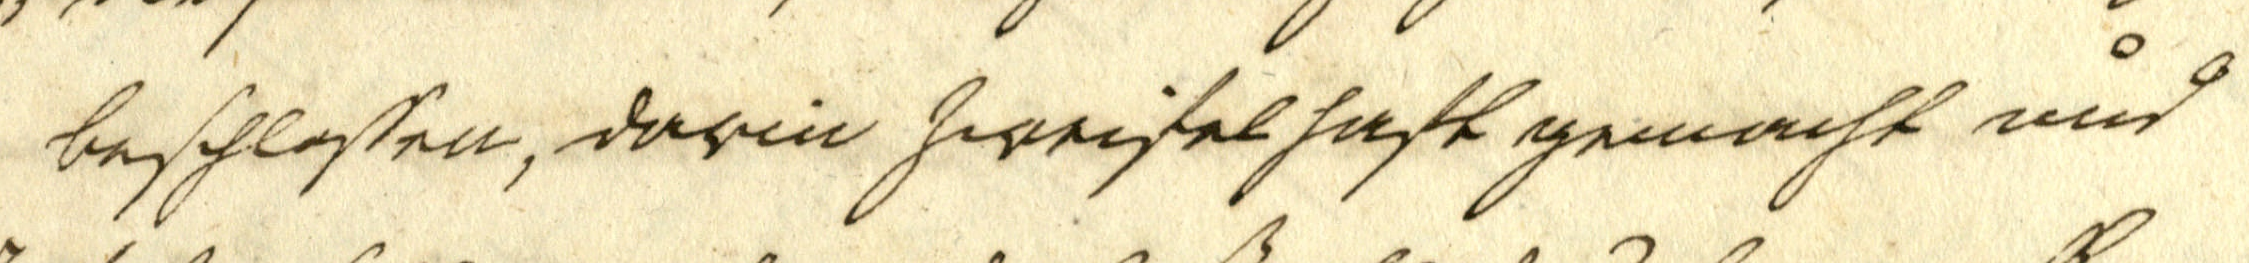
beschlossen, darin zweifel haft gemacht und
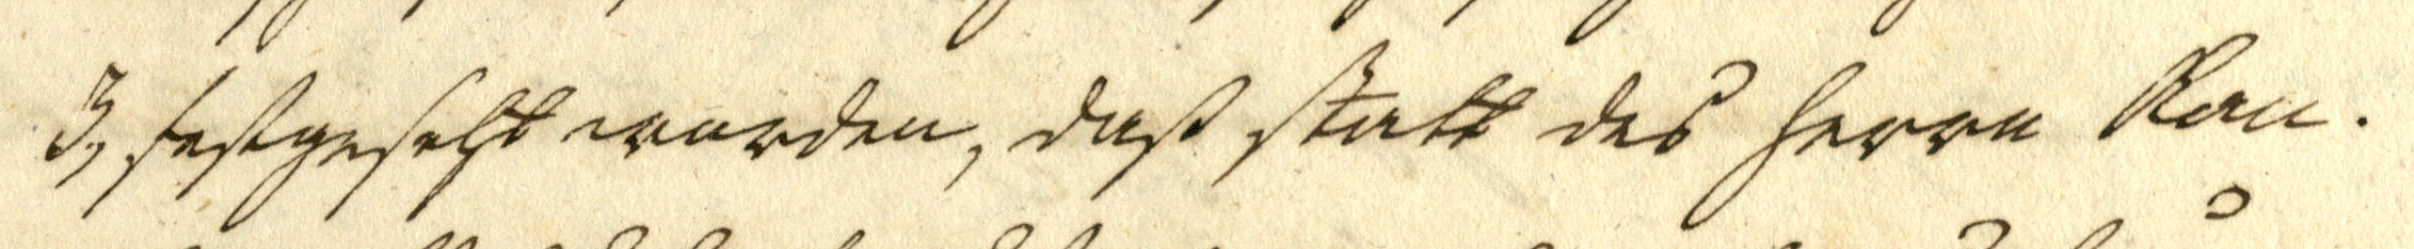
3., festgesetzt worden, daß statt des Herrn Kan
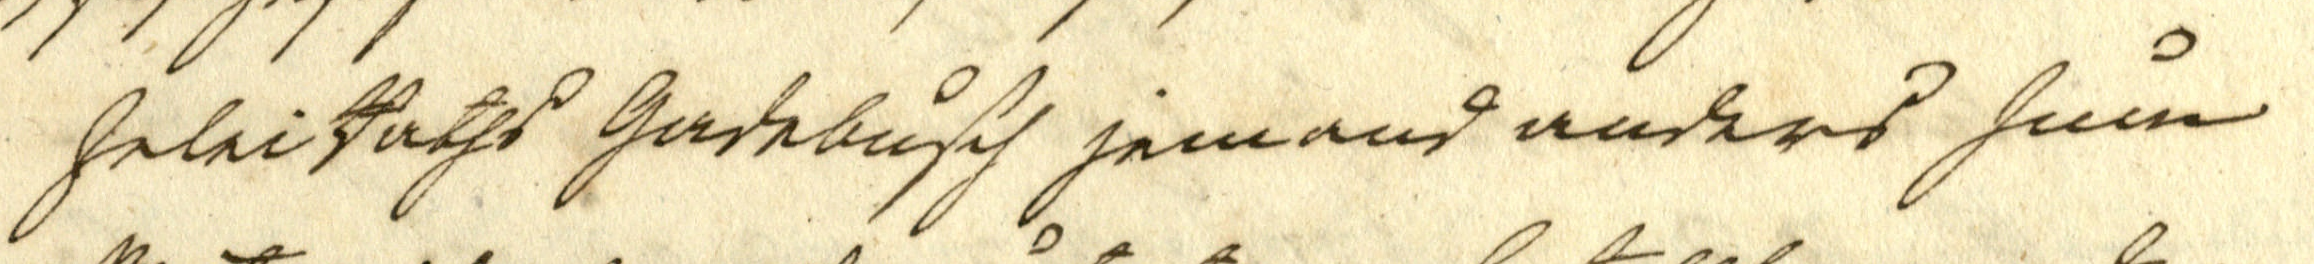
zelei Raths Gadebusch jemand anders zum
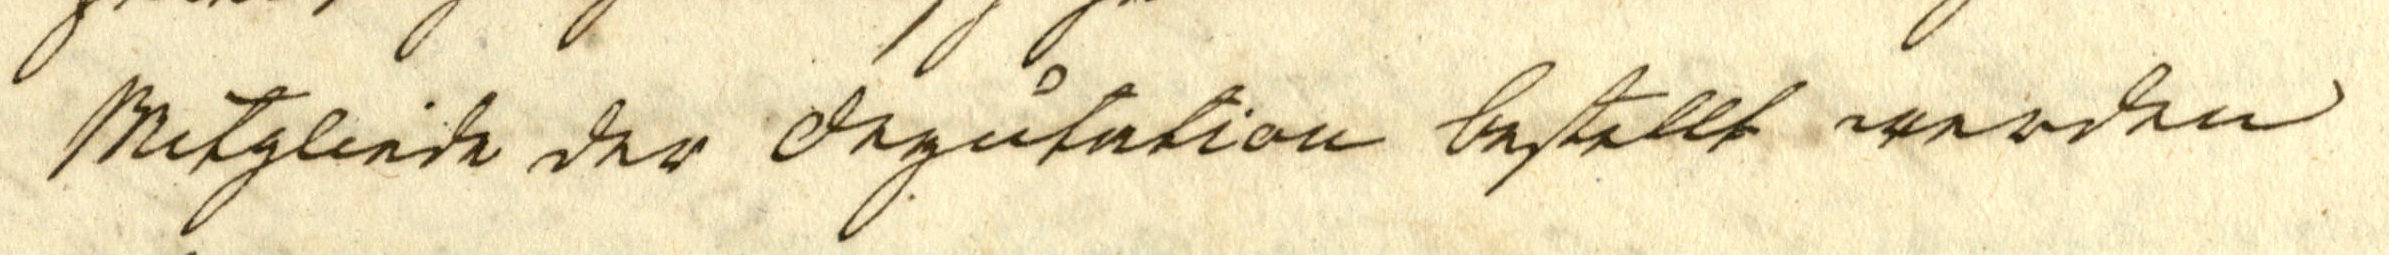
Mitgliede der Deputation bestellt werden
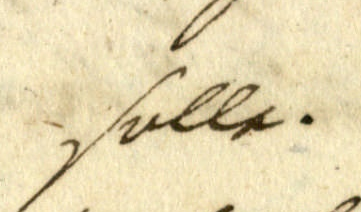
solle.
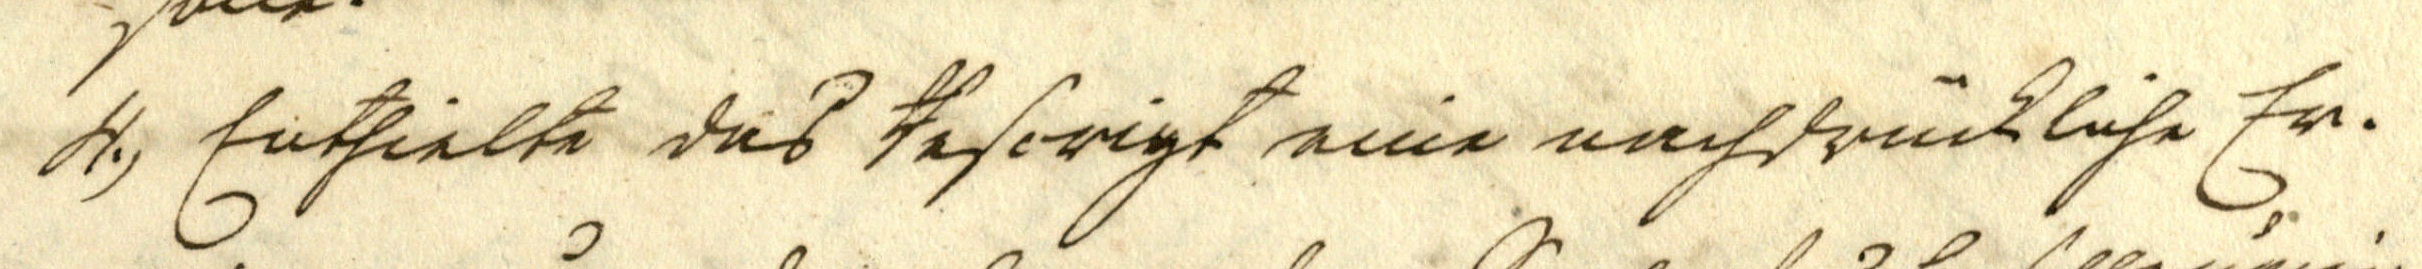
4., Enthielte das Rescript eine nachdrückliche Er¬
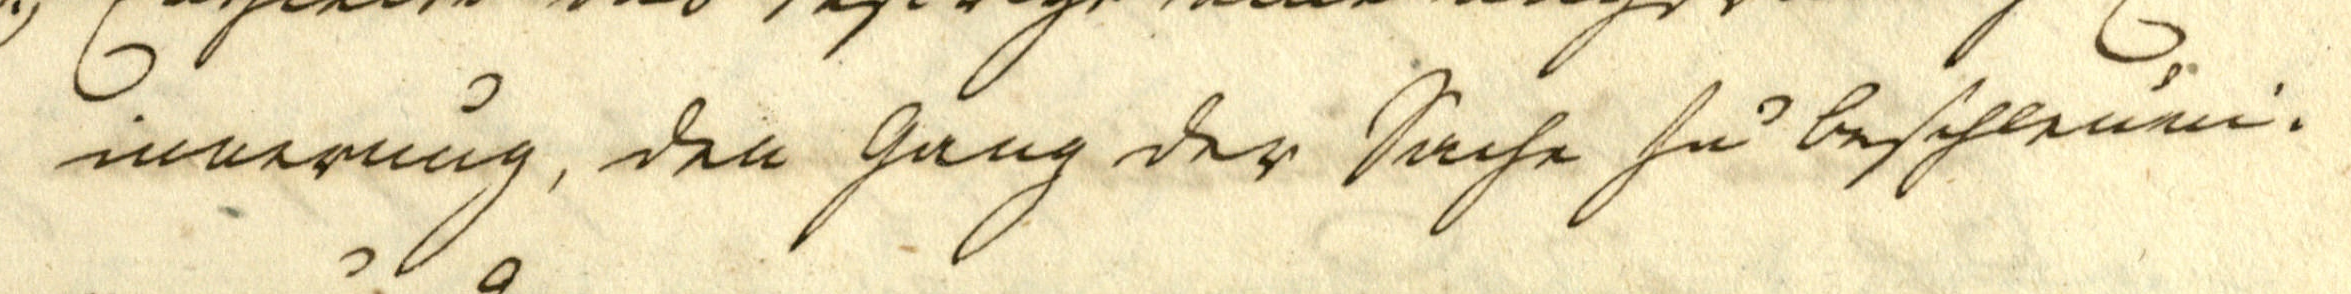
innerung, den Gang der Sache zu beschleuni¬
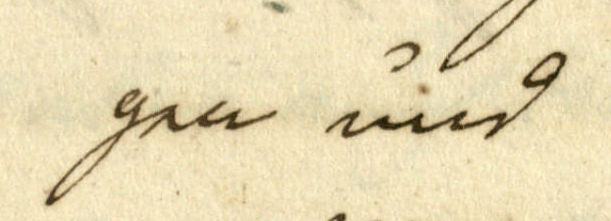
gen und
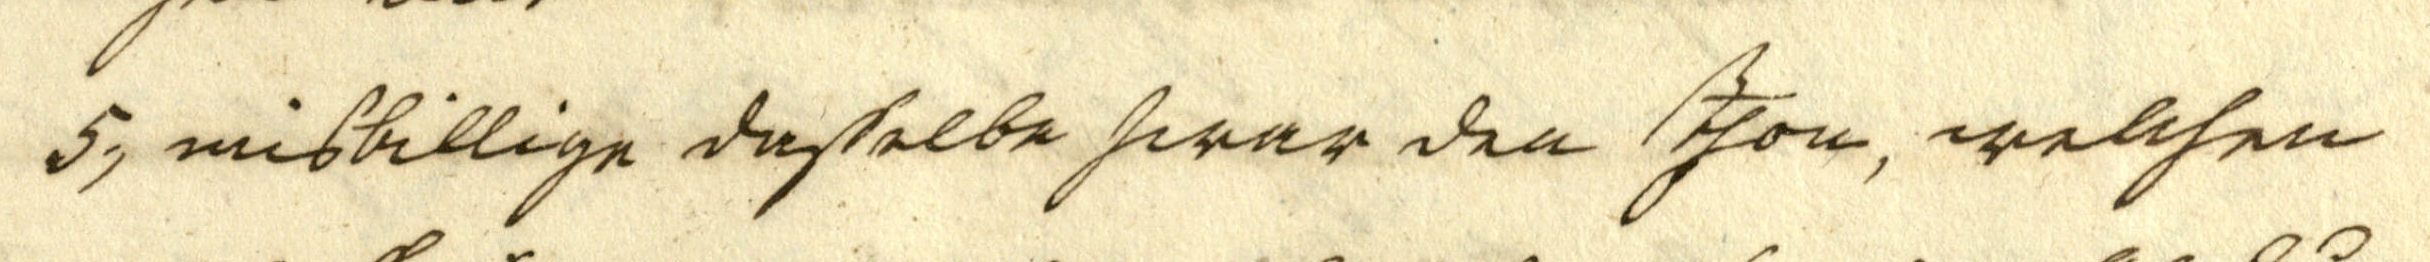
5, misbillige dasselbe zwar den Thon, welchen
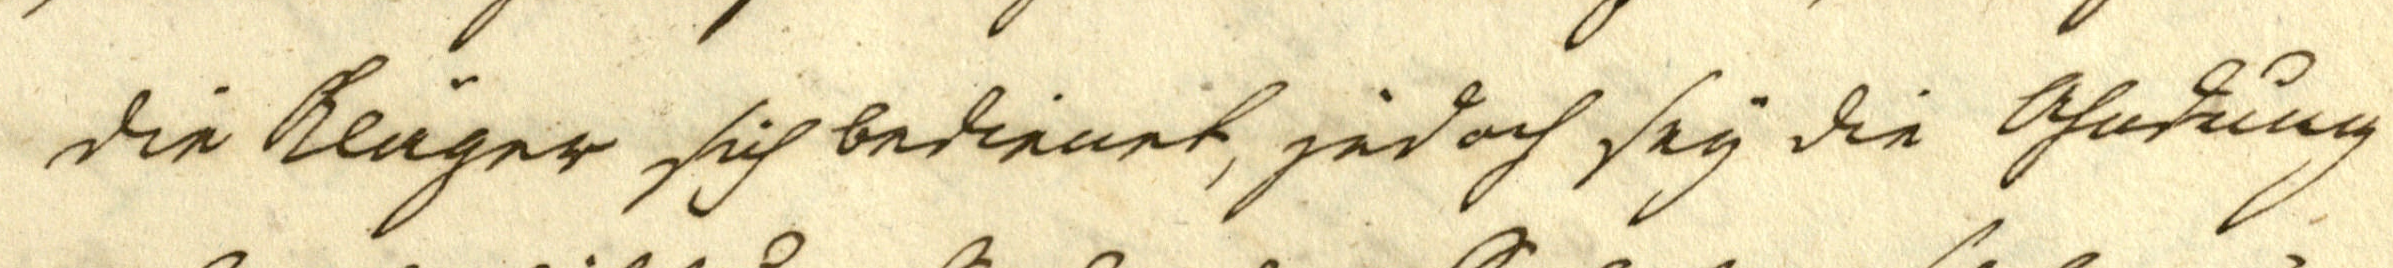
die Kläger sich bedienet, jedoch seÿ die Ahndung
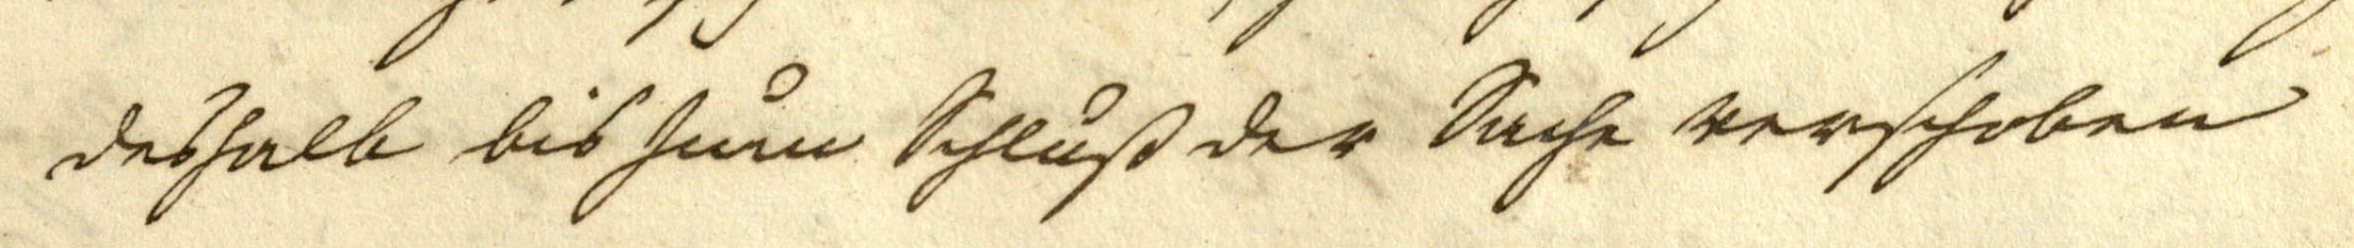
deshalb bis zum Schluß der Sache verschoben
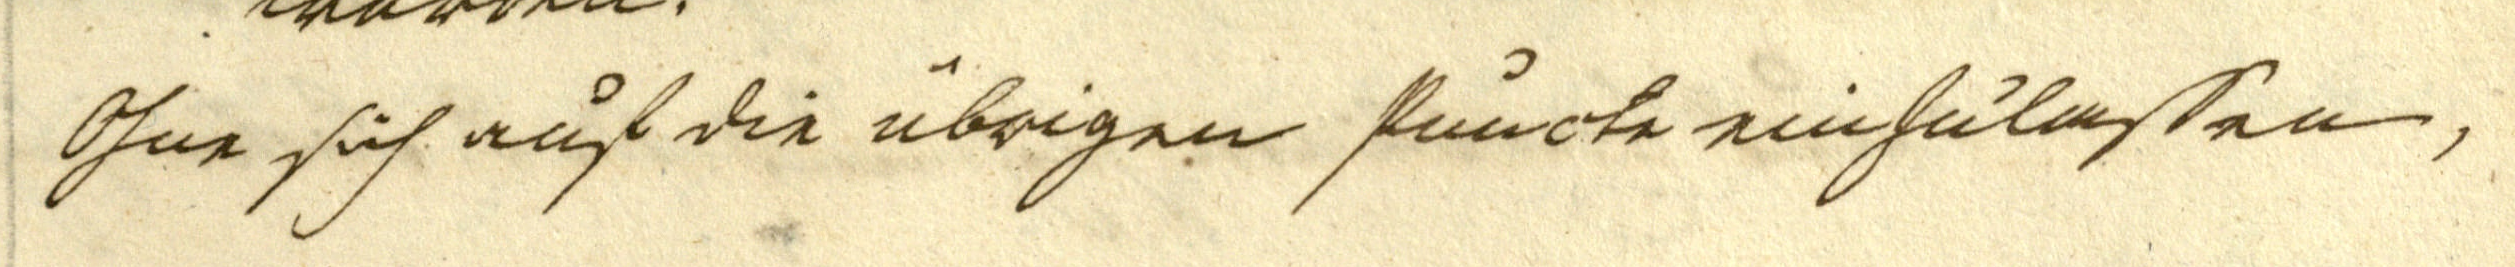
Ohne sich auf die übrigen Puncte einzulassen,
